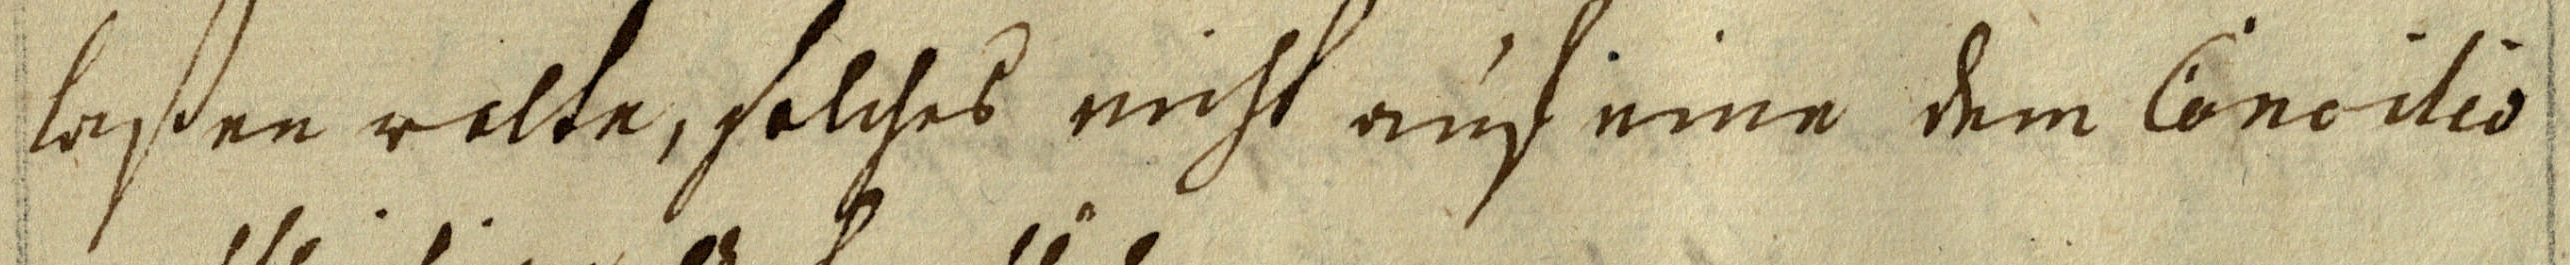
laßen wolte, solches nicht auf eine dem Concilio
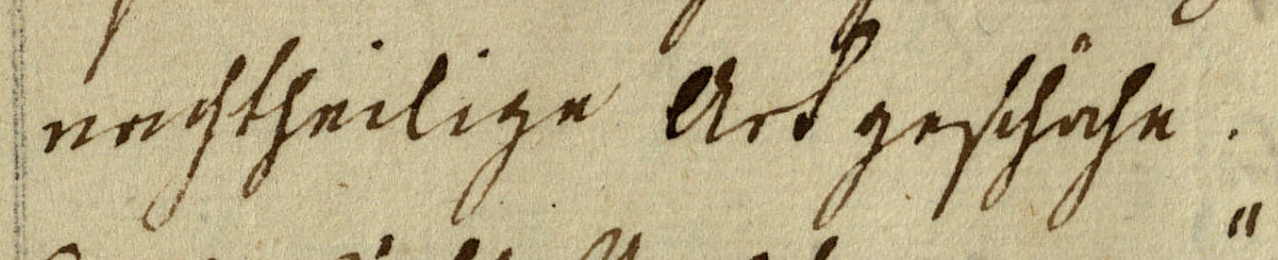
nachtheilige Art geschähe.
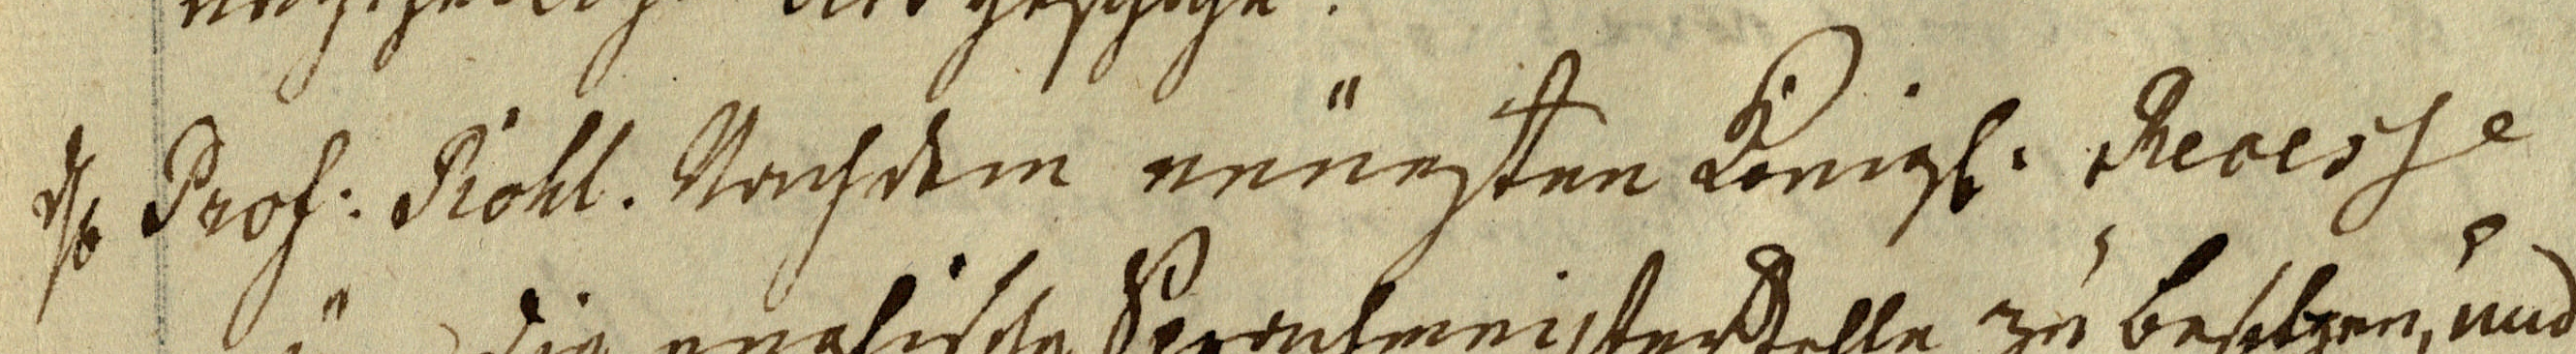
dh Prof. Röhl. Nachdem neuesten Königl. Recesse
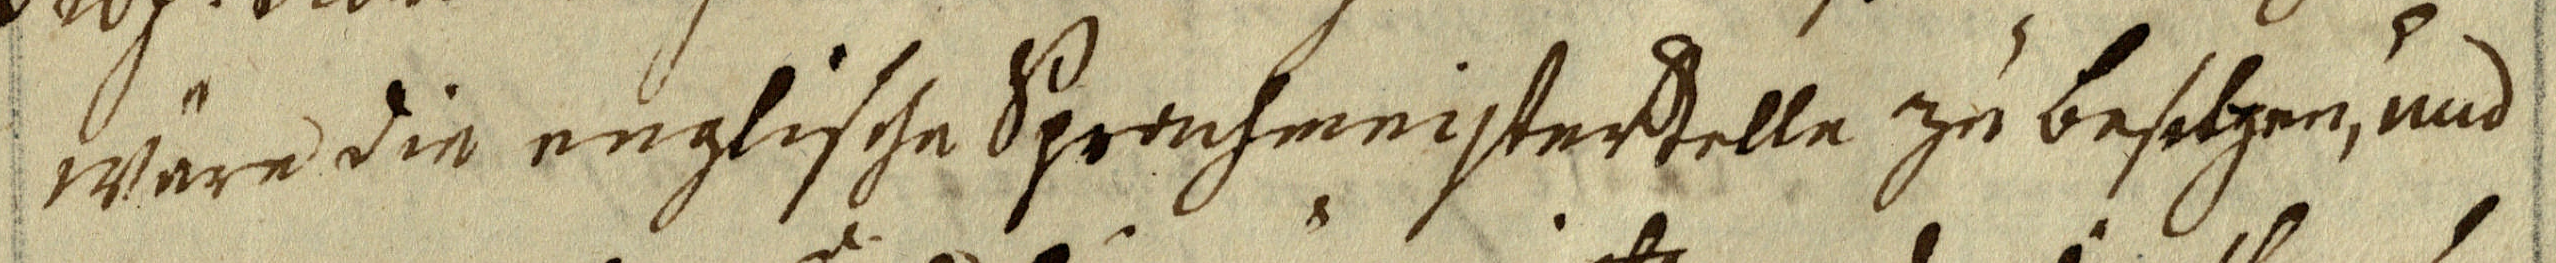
wäre die englische Sprachmeisterstelle zu besetzen, und
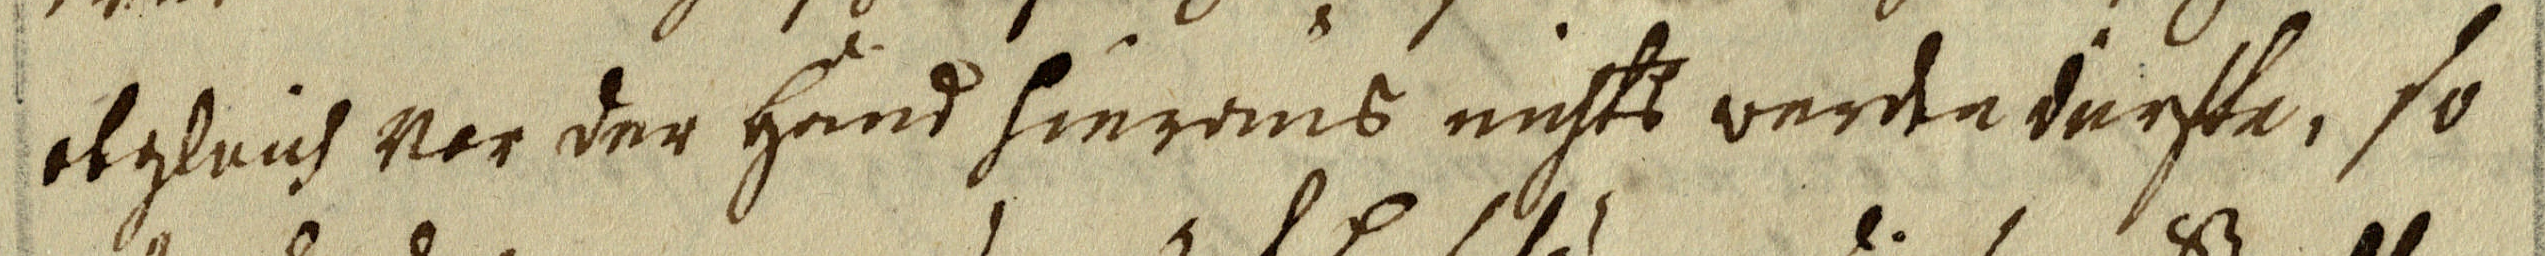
obgleich vor der Hand hieraus nichts werden dürfte, so
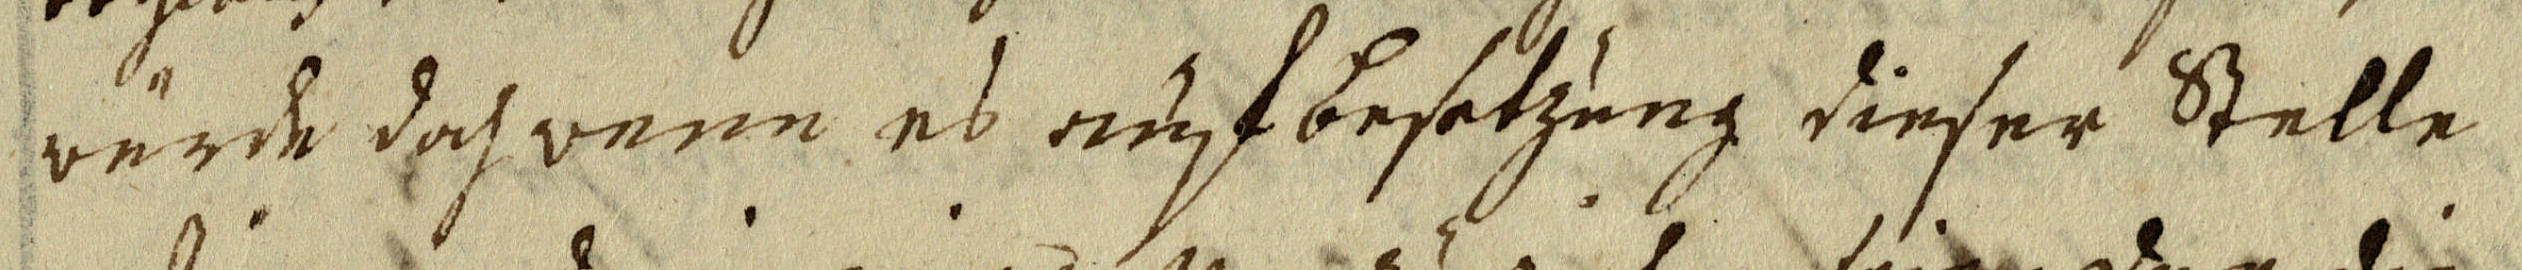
würde doch wenn es auf Besetzung dieser Stelle
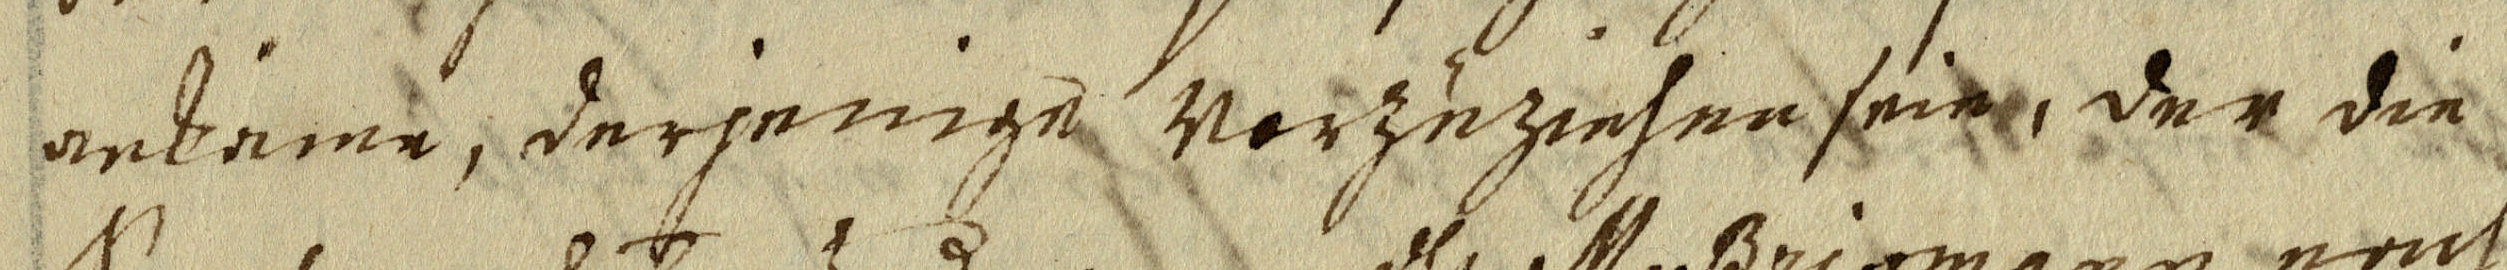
ankäme, derjenige vorzuziehen sein, der die
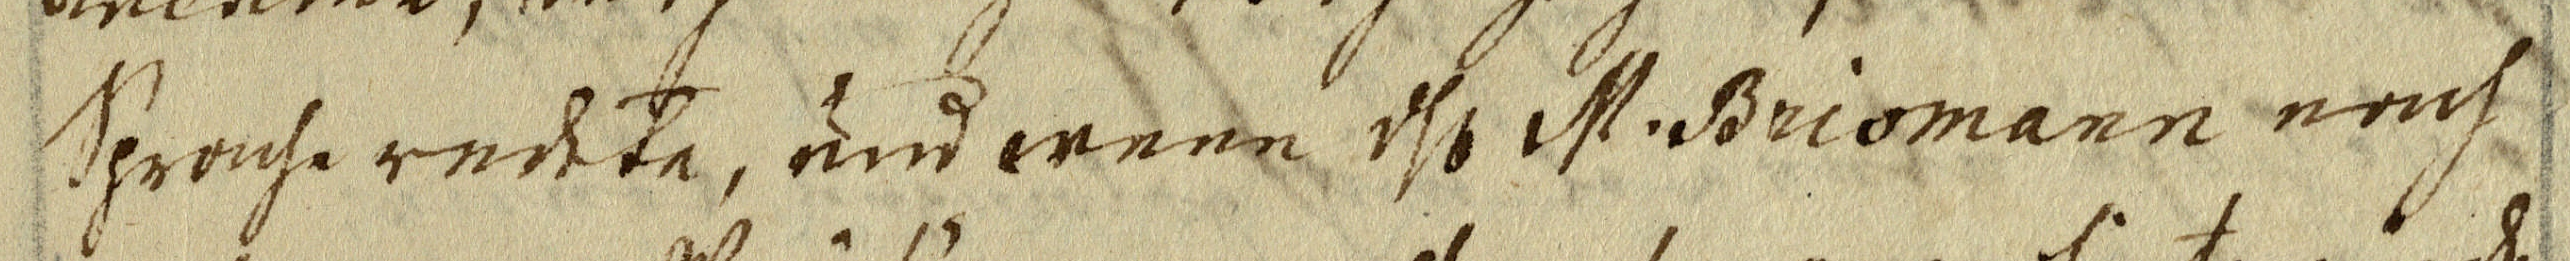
Sprache redete, und wenn dh M. Brismann nach
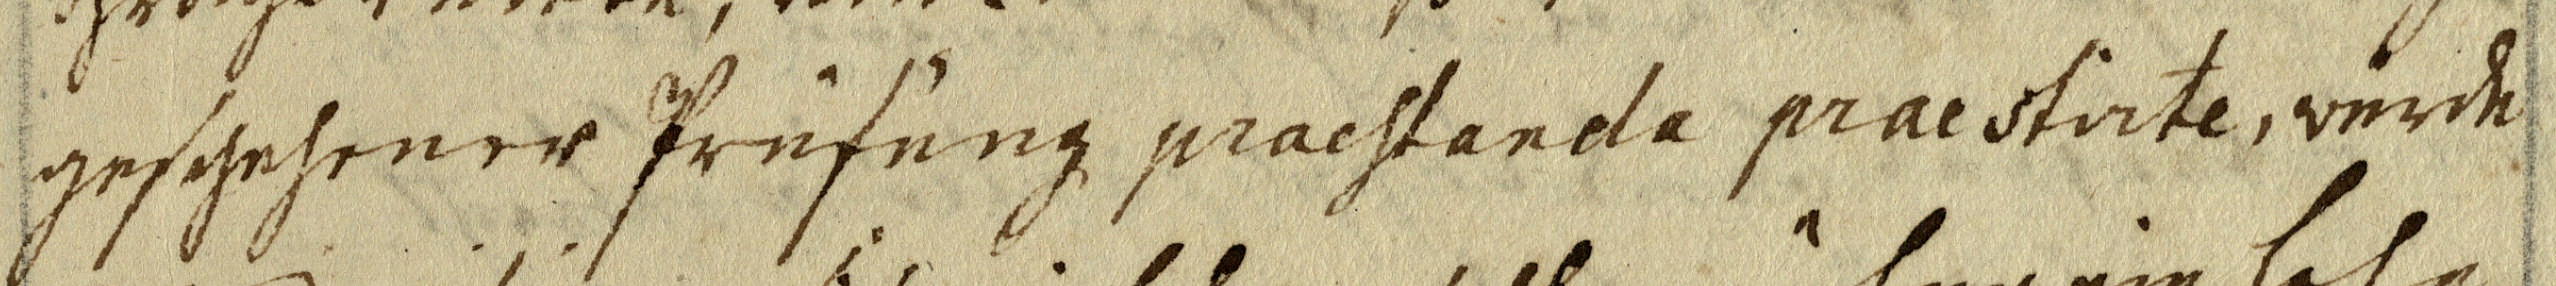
geschehener Prüfung praestanda praestirte, würde
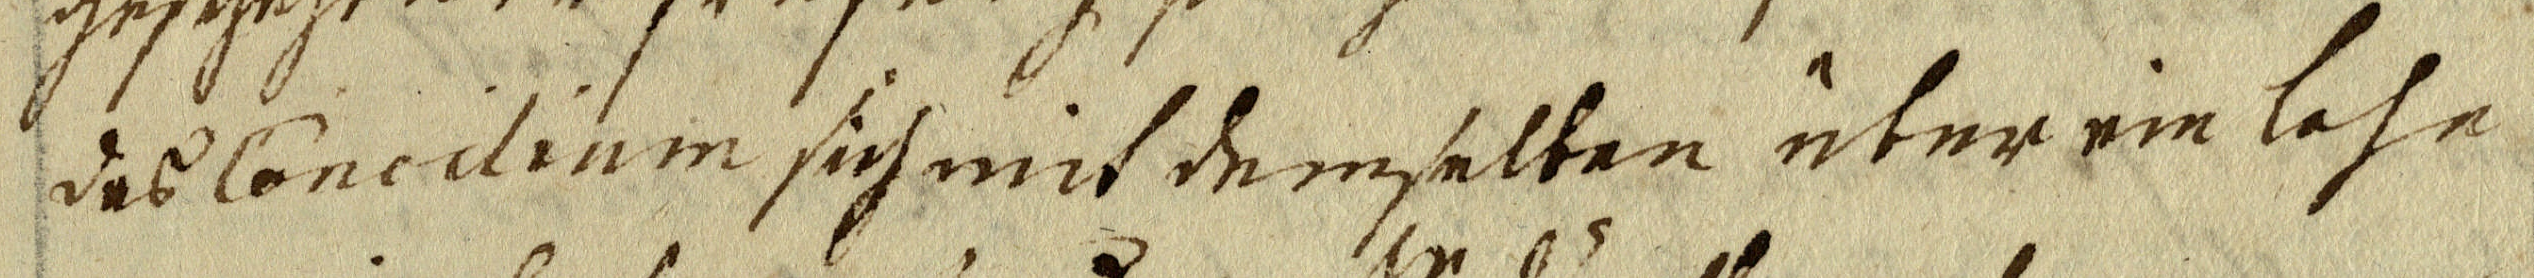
das Concilium sich mit demselben über ein Lohn
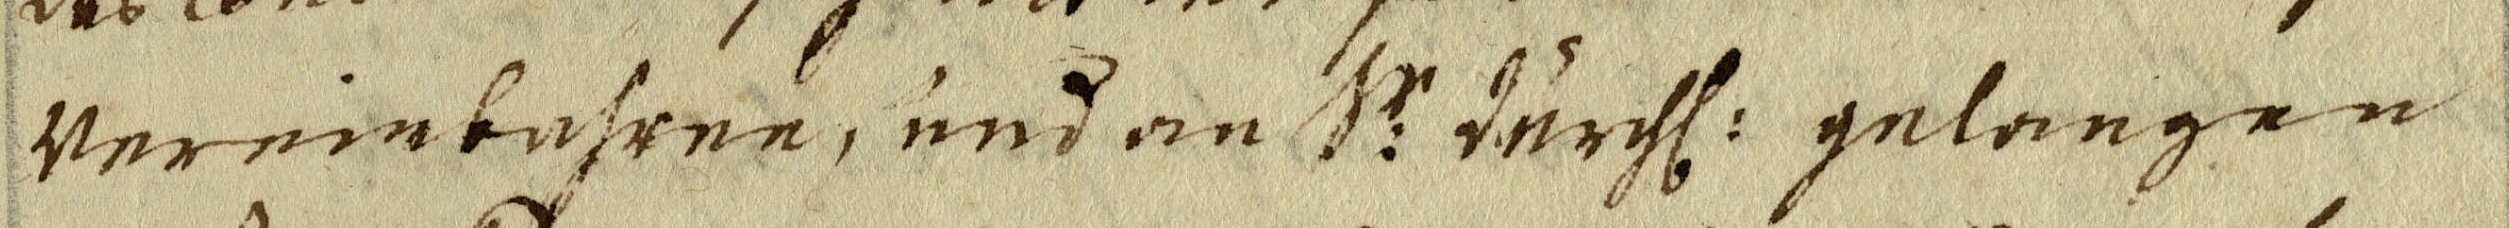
vereinbahren, und an Sr Durchl. gelangen
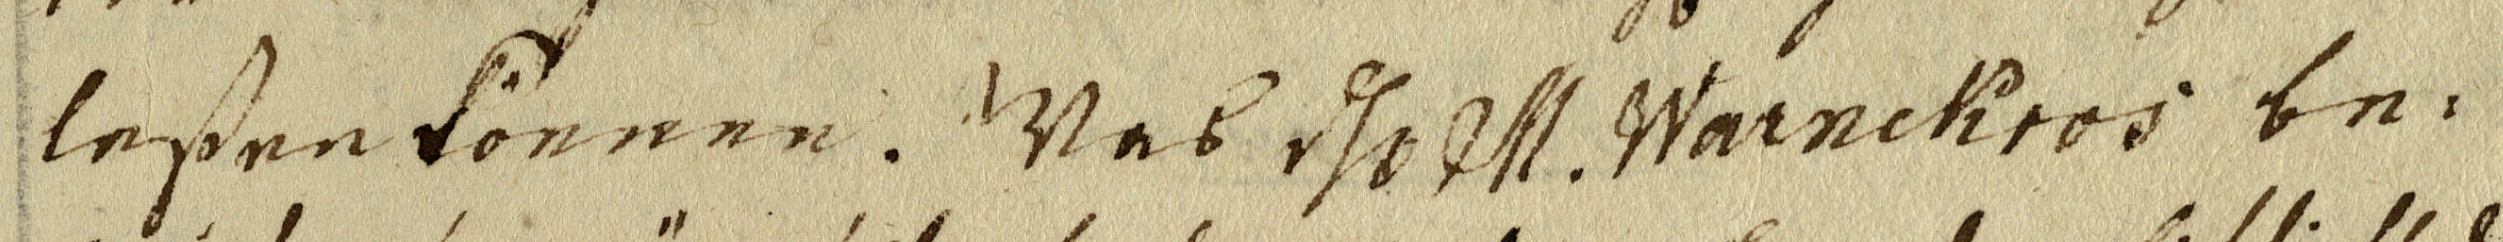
laßen können. Was dh M. Warnekros be¬
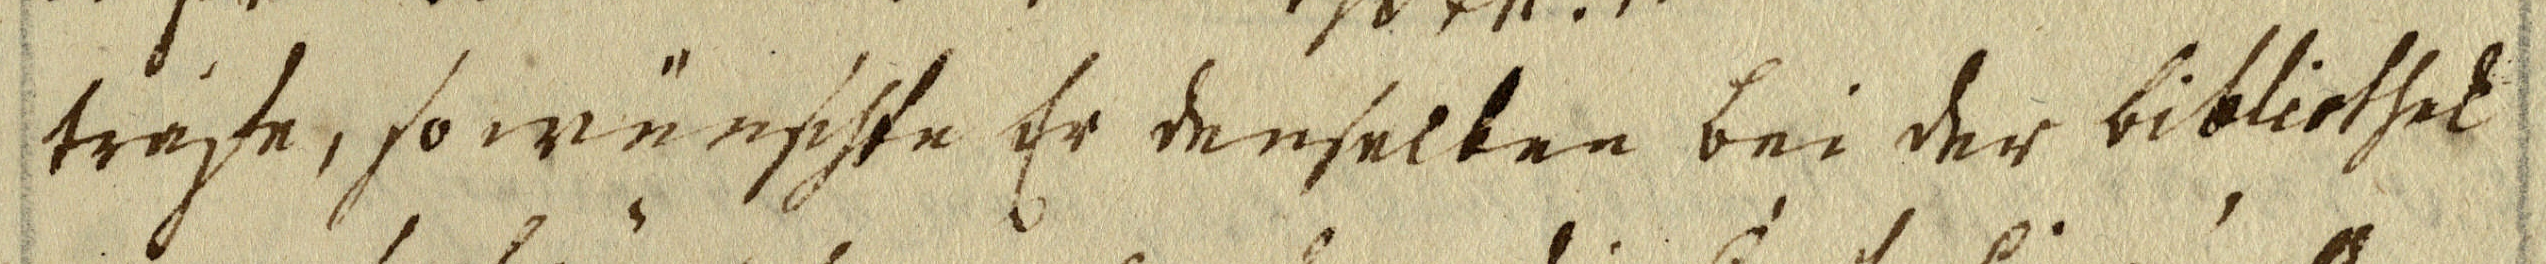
träfe, so wünschte Er denselben bei der Bibliothek
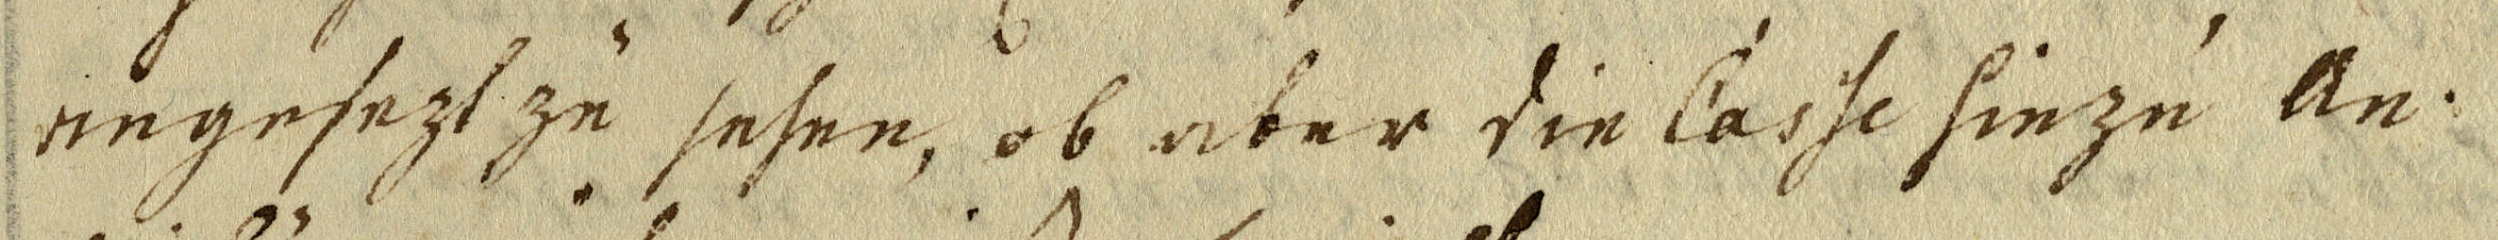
eingesezt zu sehen, ob aber die Casse hiezu An¬
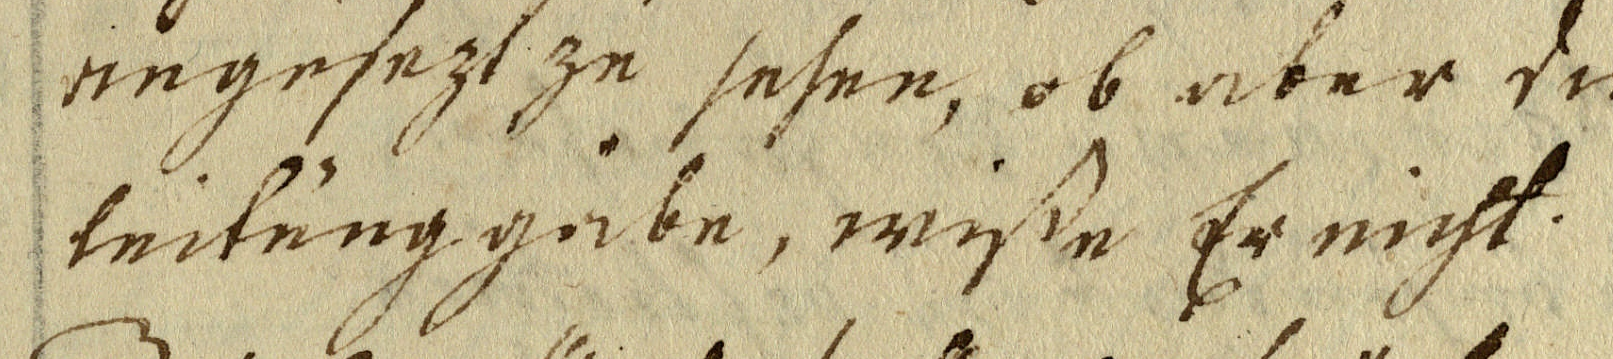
leitung gäbe, wiße Er nicht.
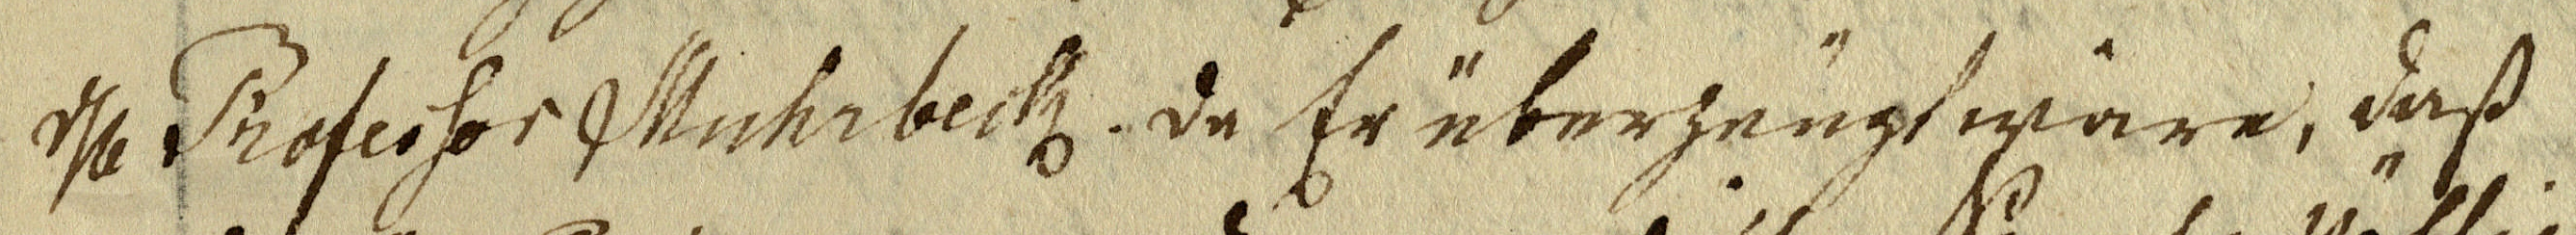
dh Professor Muhrbeck. Da Er überzeugt wäre, daß
